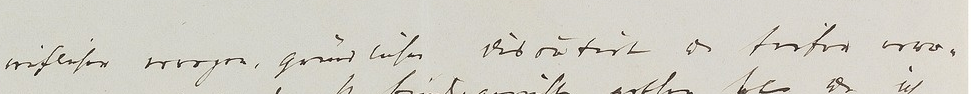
reiflicher erwogen, gründlicher discutirt u. tiefer erwo-
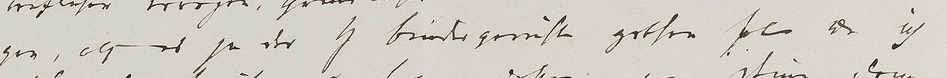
gen, als es je das H Bundesgericht gethan hat u. ich
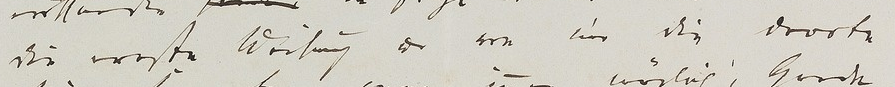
die ernste Weisung u. von mir die devote
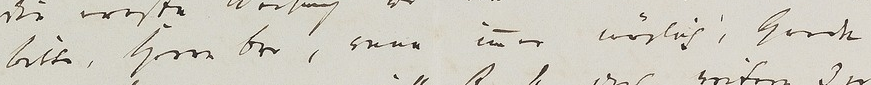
Bitte, Herrn Br, wenn immer möglich, Gnade
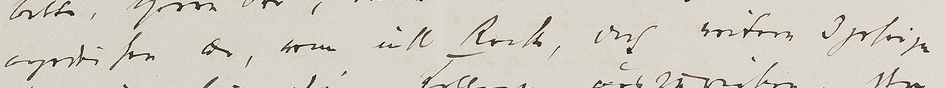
angedeihen u., wenn nicht Recht, doch weitere 3jehrige
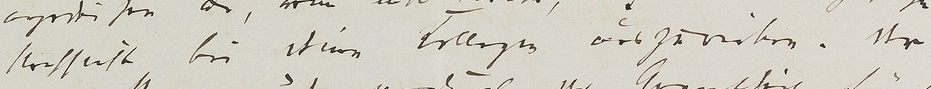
Nachsicht bei deinen Collegen auszuwirken. Der
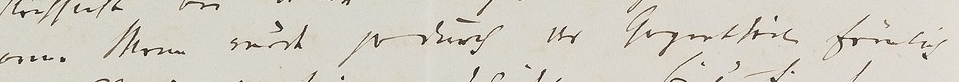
arme Mann würde so durch das Gegentheil förmlich
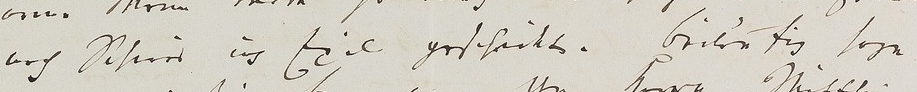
nach Schiers ins Exil geschickt. Beiläufig sage
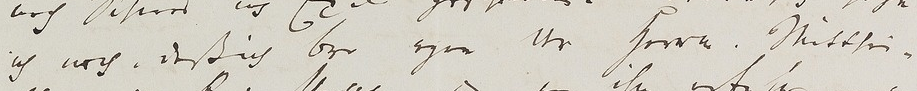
ich noch, daß ich Br wegen der Herren Mitthei-
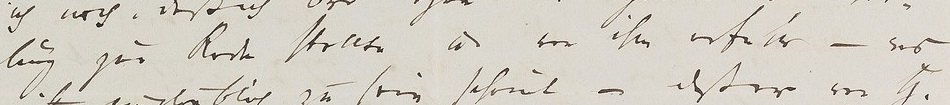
lung zur Rede stellte u. von ihm erfuhr – was
